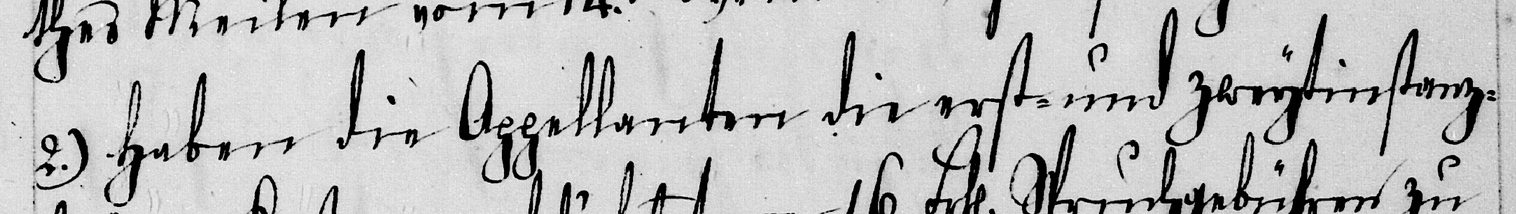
2.) haben die Appellanten die erst- und zweytinstanz¬
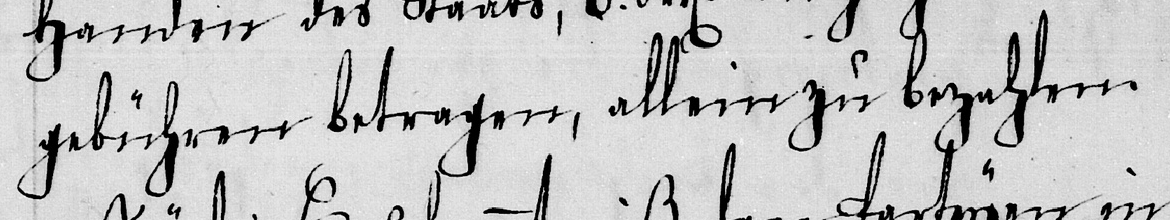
gebühren betragen, allein zu bezahlen.
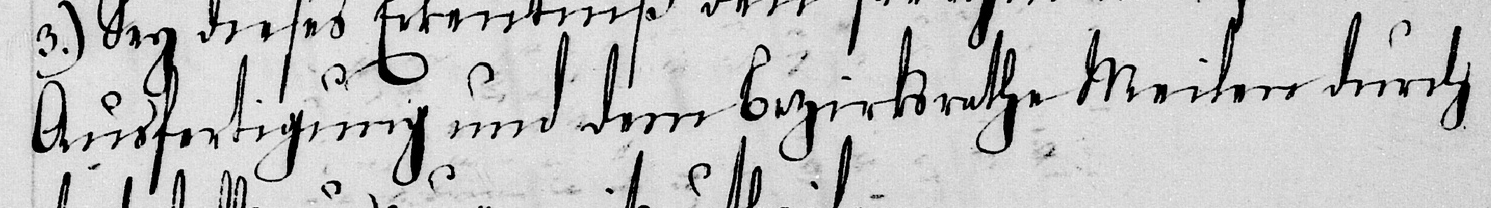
Ausfertigung und dem Bezirksrathe Meilen durch
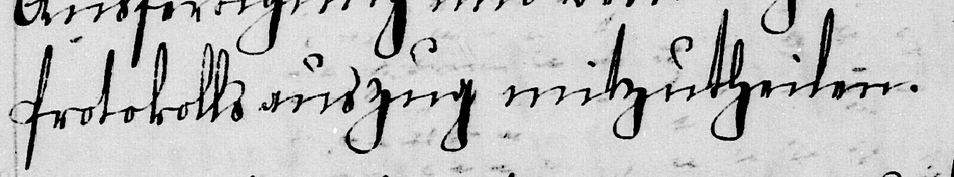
Protokollsauszug mitzutheilen.
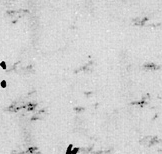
3.)
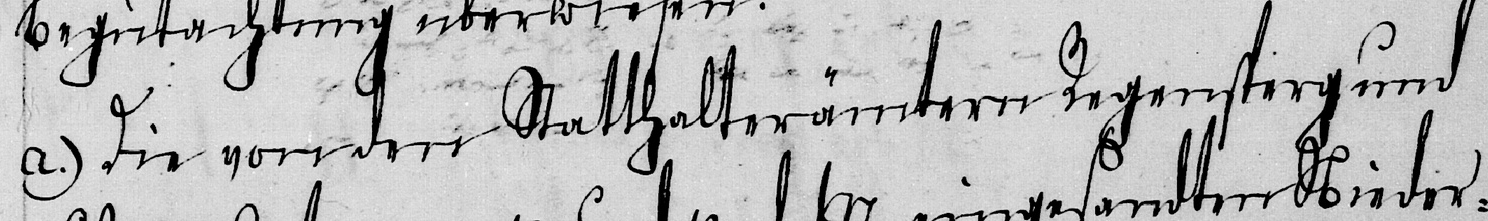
a.) Die von den Statthalterämtern Regensperg und
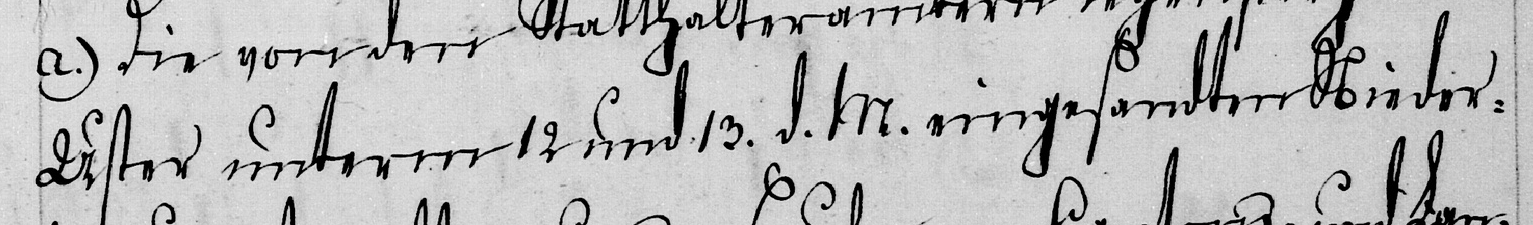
Uster unterm 12 und 13. d. M. eingesandten Nieder¬
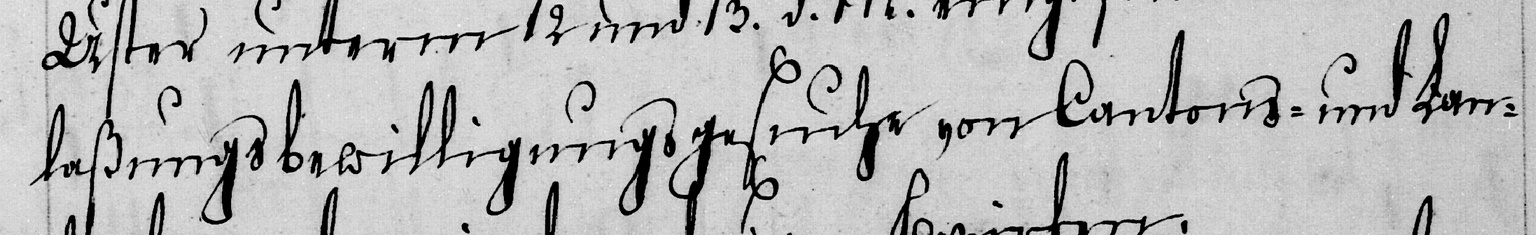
laßungsbewilligungsgesuche von Cantons- und Lan¬
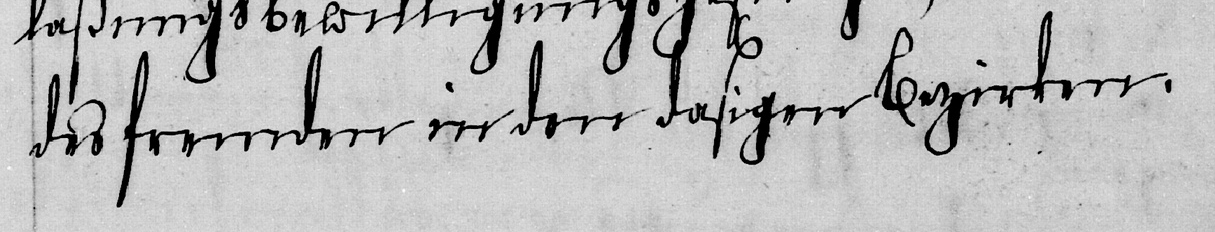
desfremden in den dasigen Bezirken.
